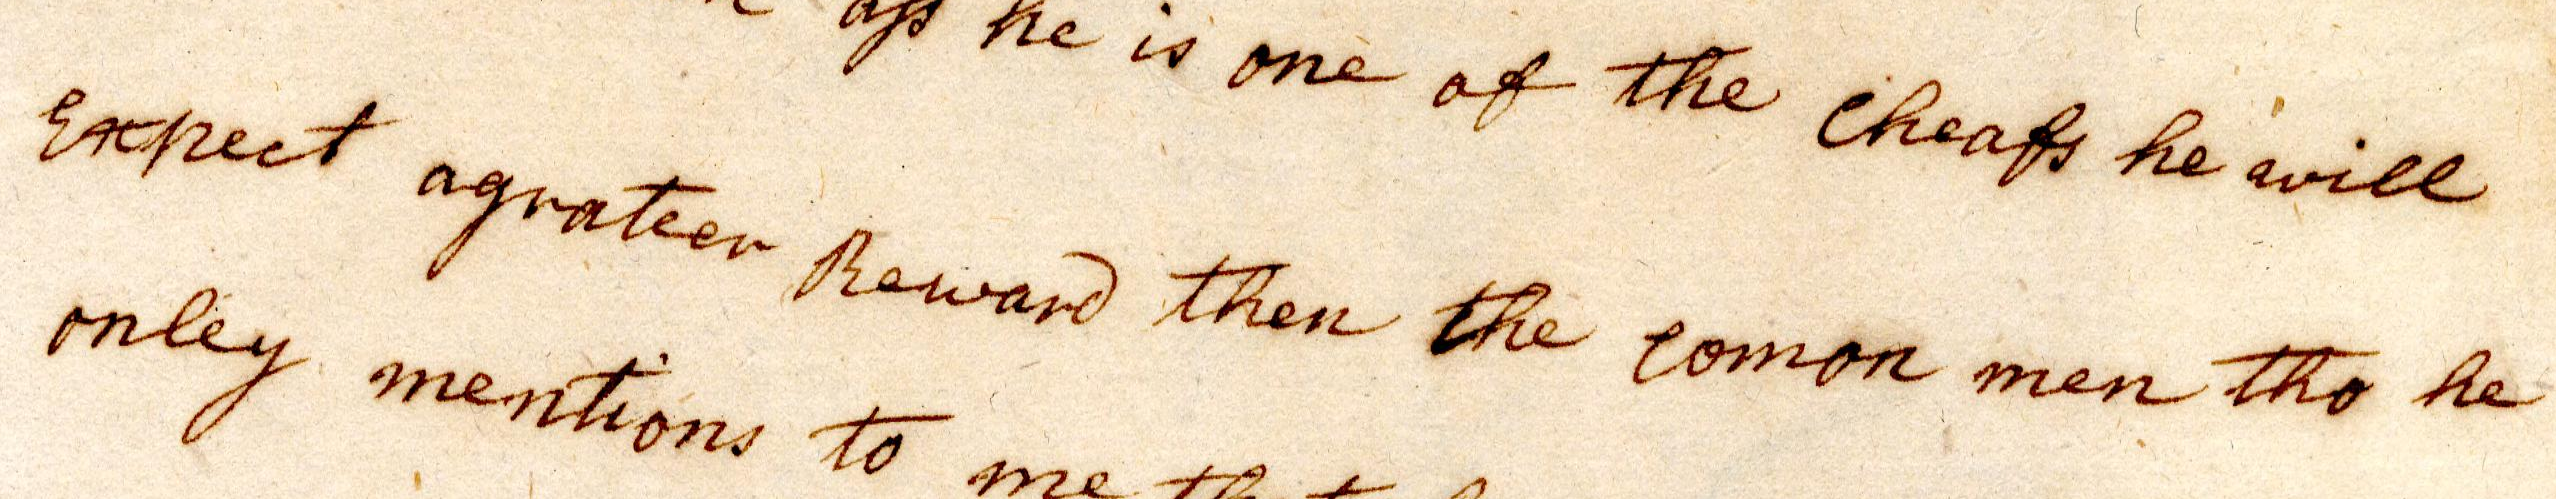expect a grateer Reward then the comon men tho he
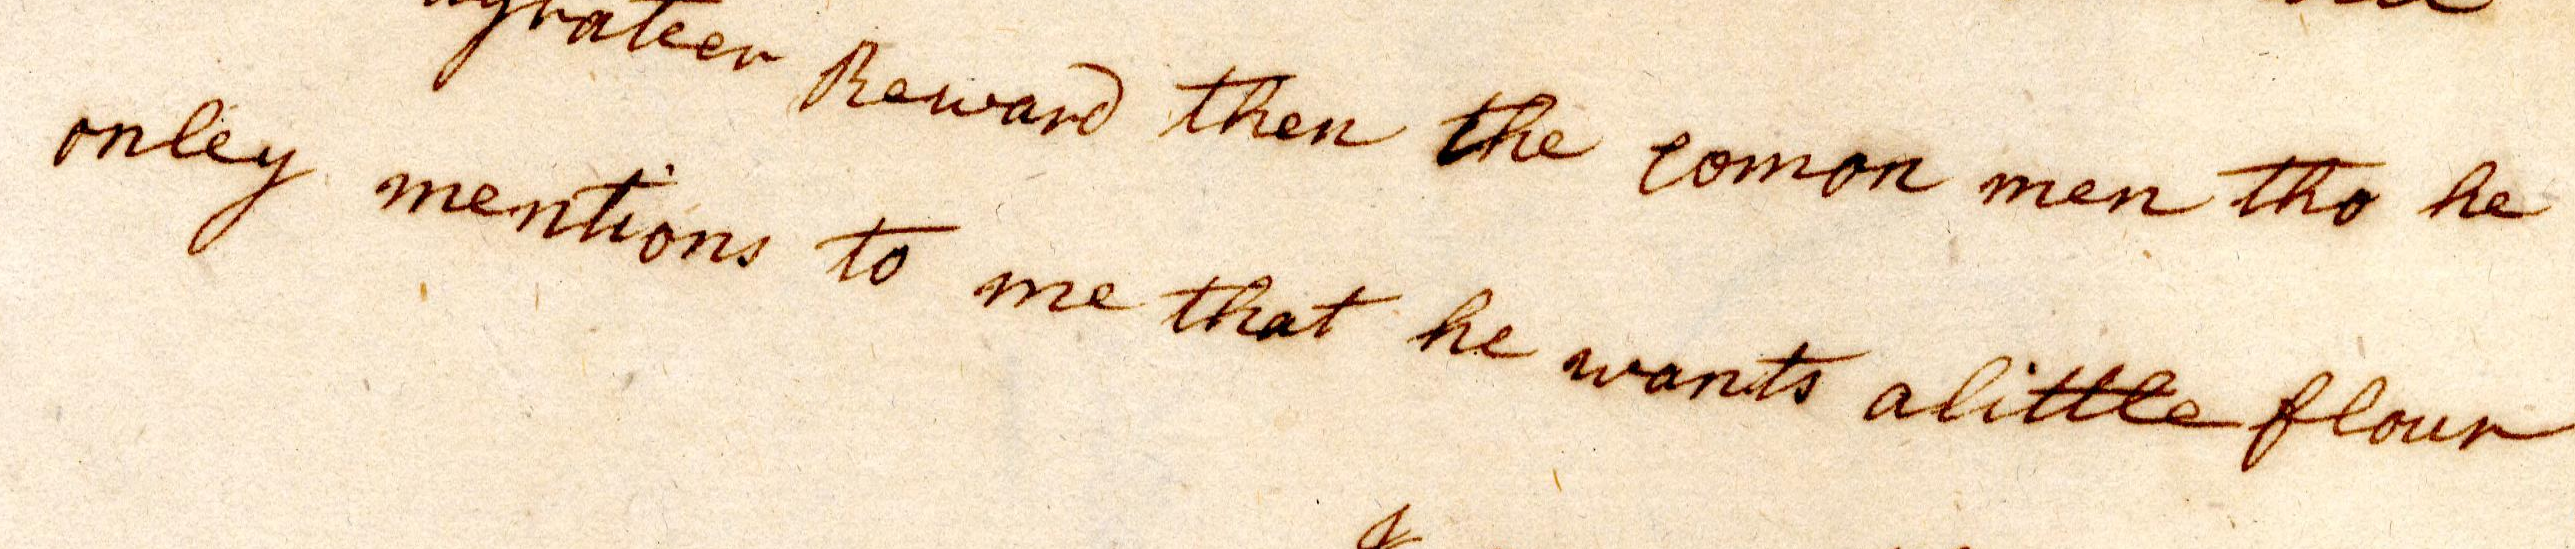onley mentions to me that he wants alittle flour
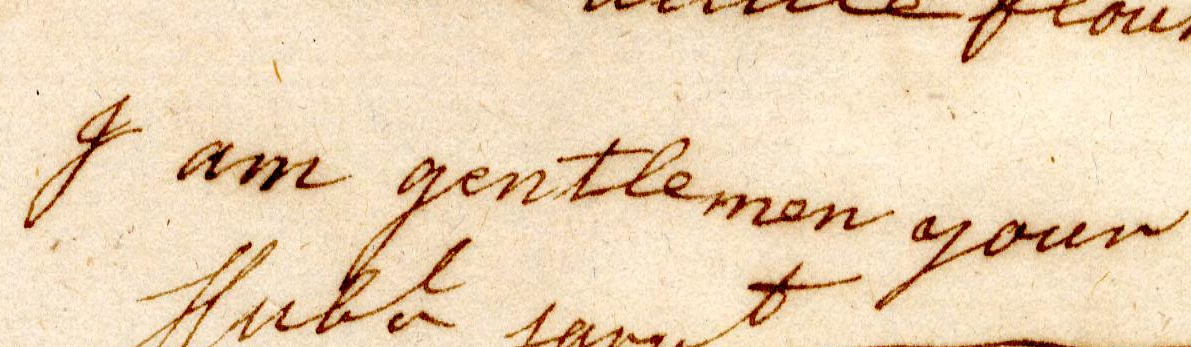I am gentlemen your
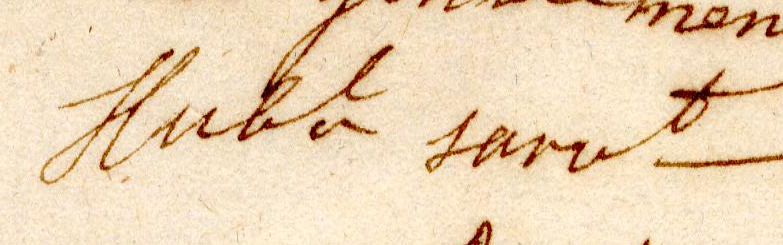Hub^l sarv^t-
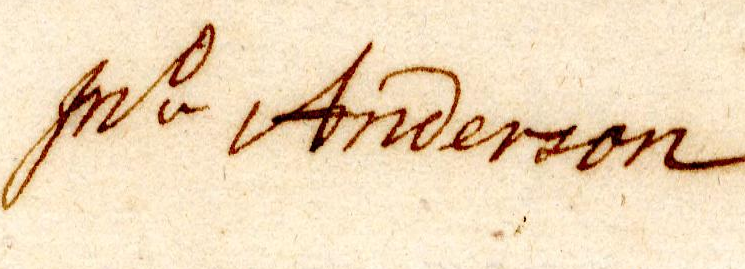Jn^o Anderson
